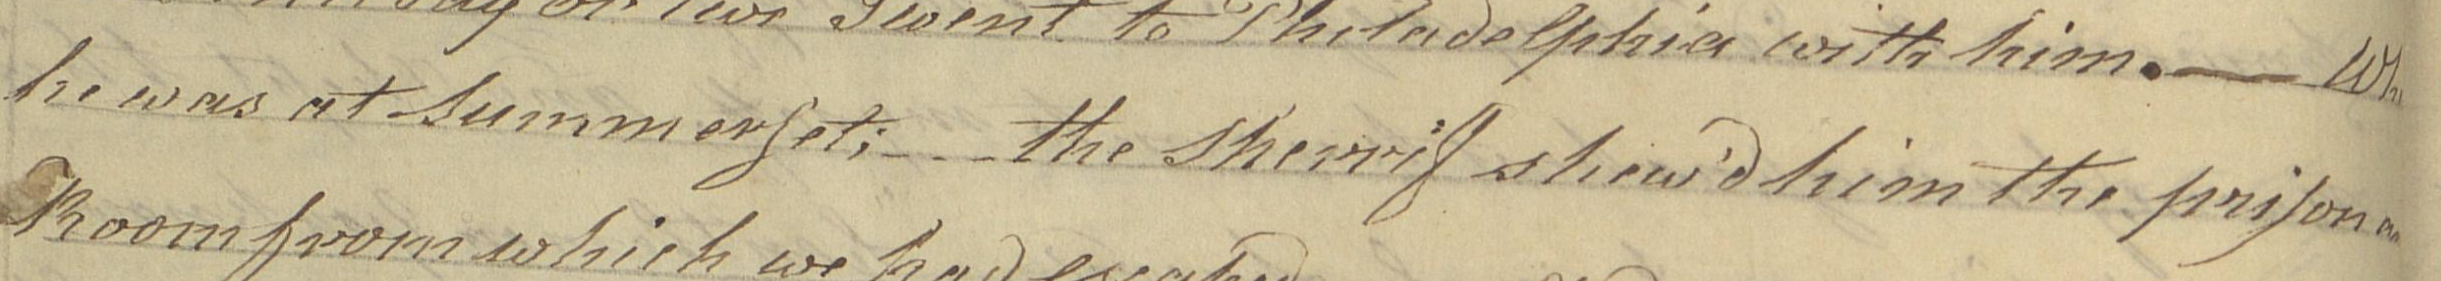he was at summerset; the sherriif show'd him the prison
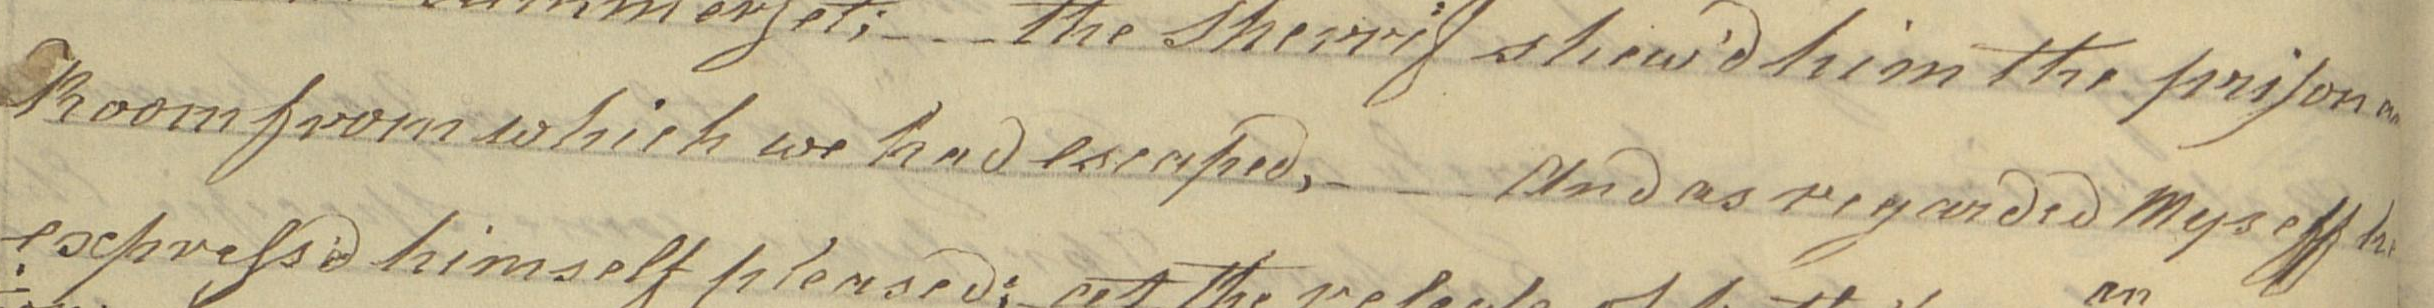Room from which we had escaped. And as regarded Myself he
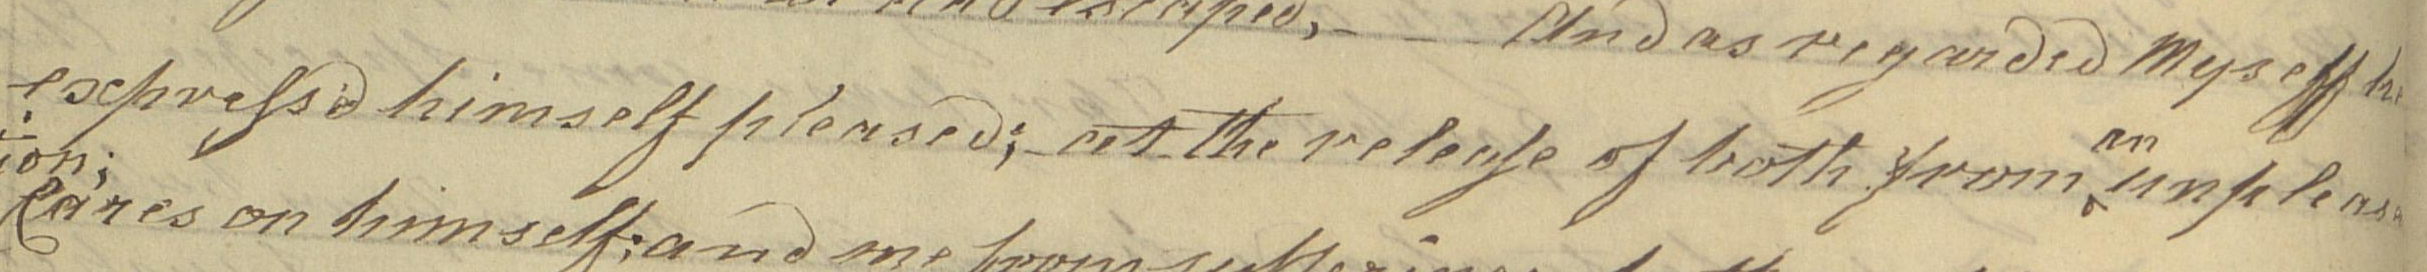exepressd himself pleased; at the release of both from ^ unpleas-
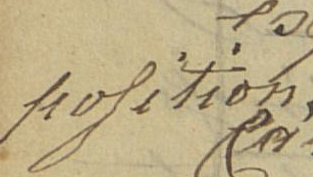position,
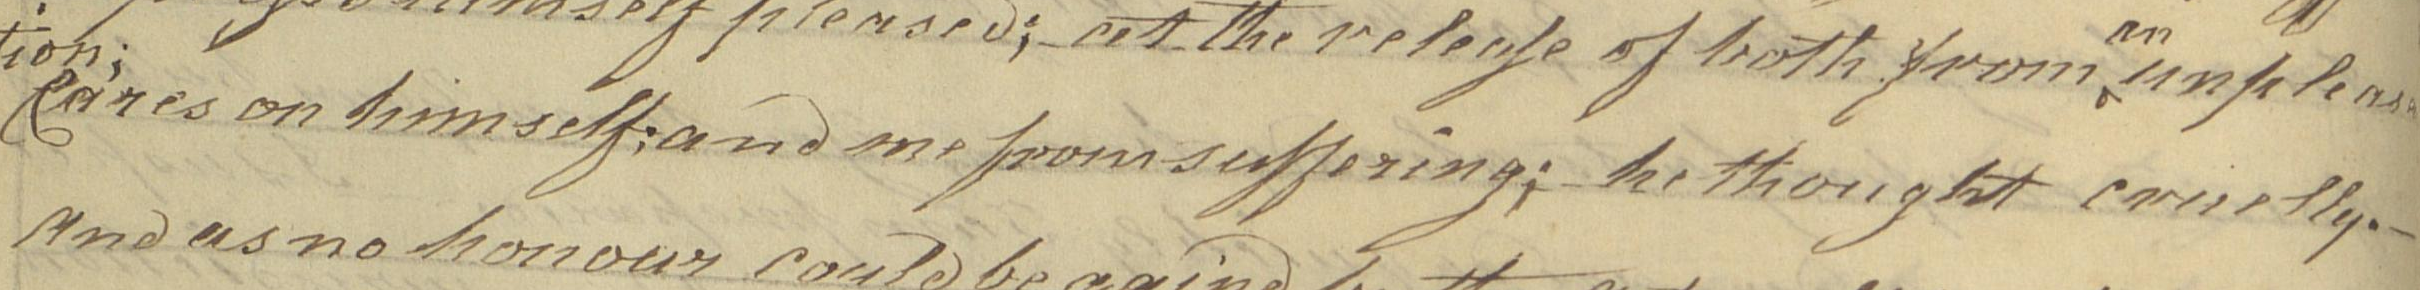Cares on himself; and one from suffering; he thought cruelty.
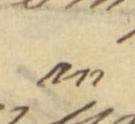an
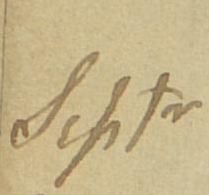Sept^r.
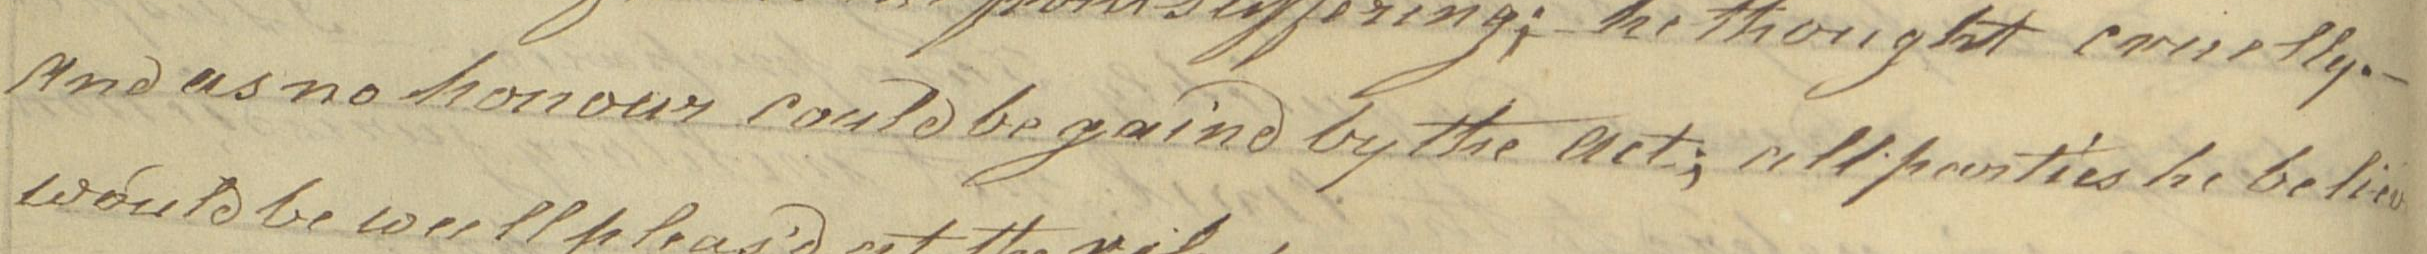and as no honour could be gaind by the Act; all parties he belie-
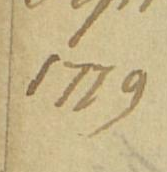1779
